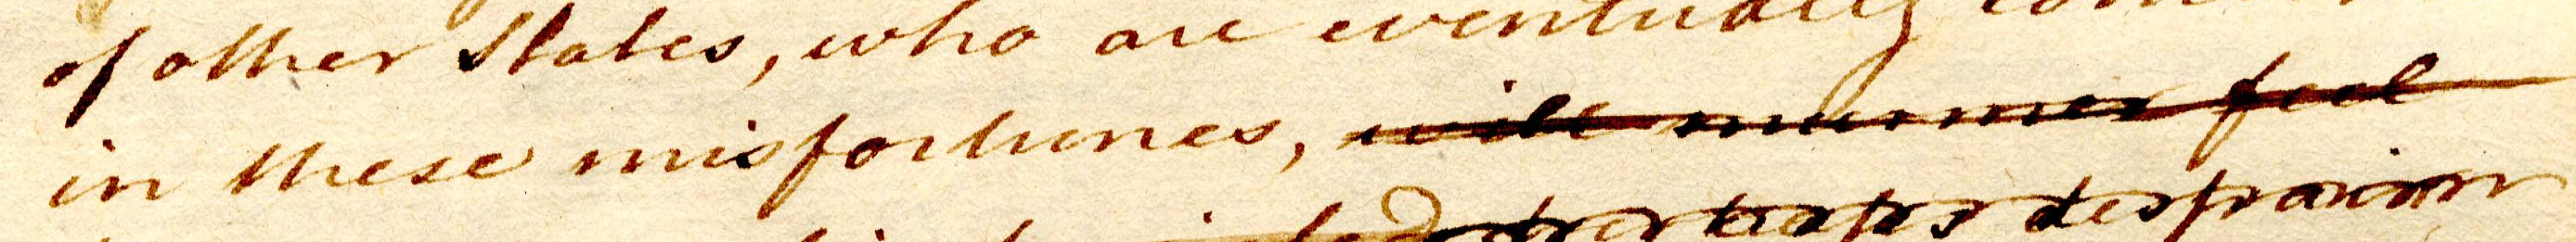in these misfortunes, [will ______ feel
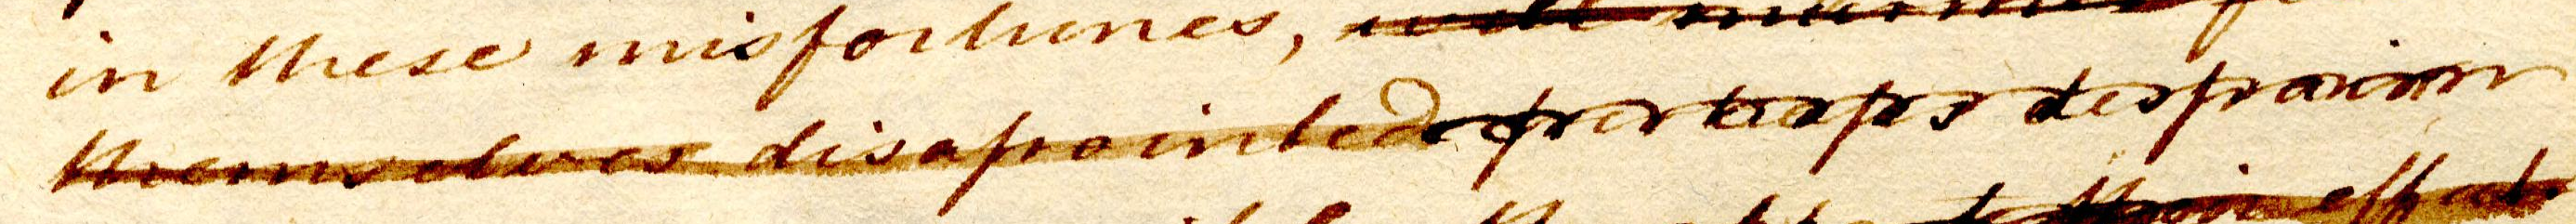[themselves disapointed perhaps despair]
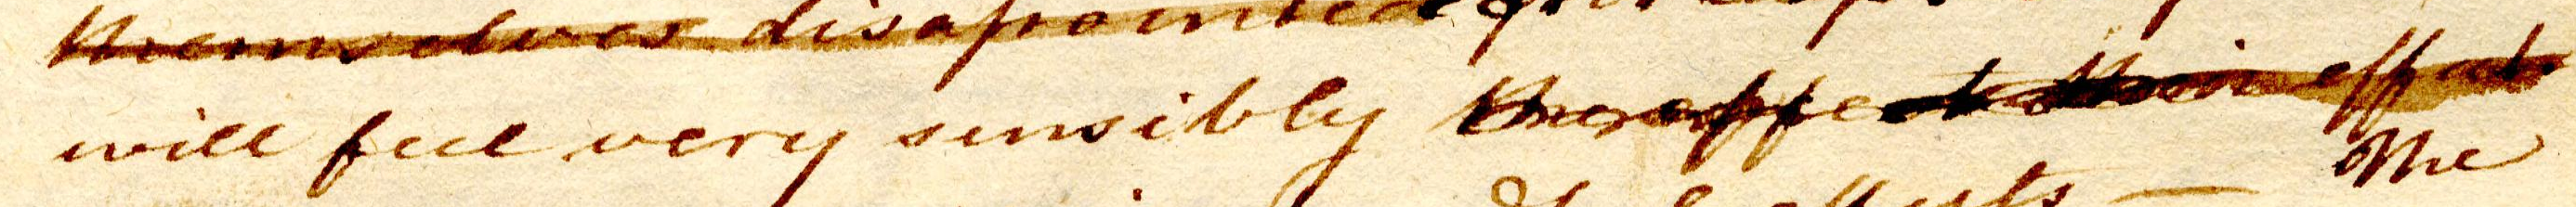will feel very sensibly [______________]
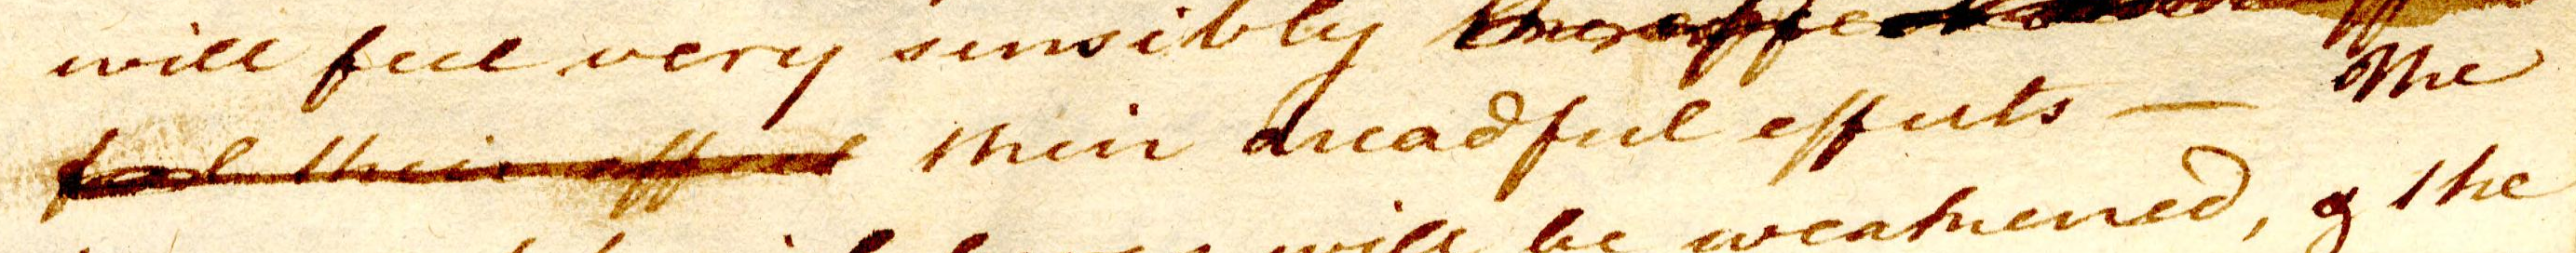[feel their effects] their dreadful effects- the
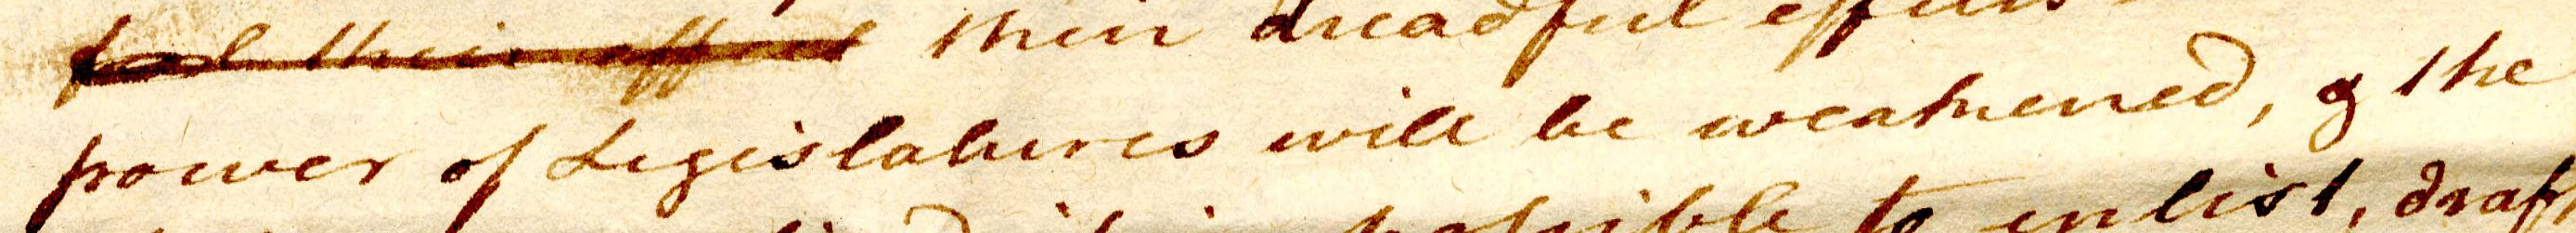power of Legislatures will be weakened, & the
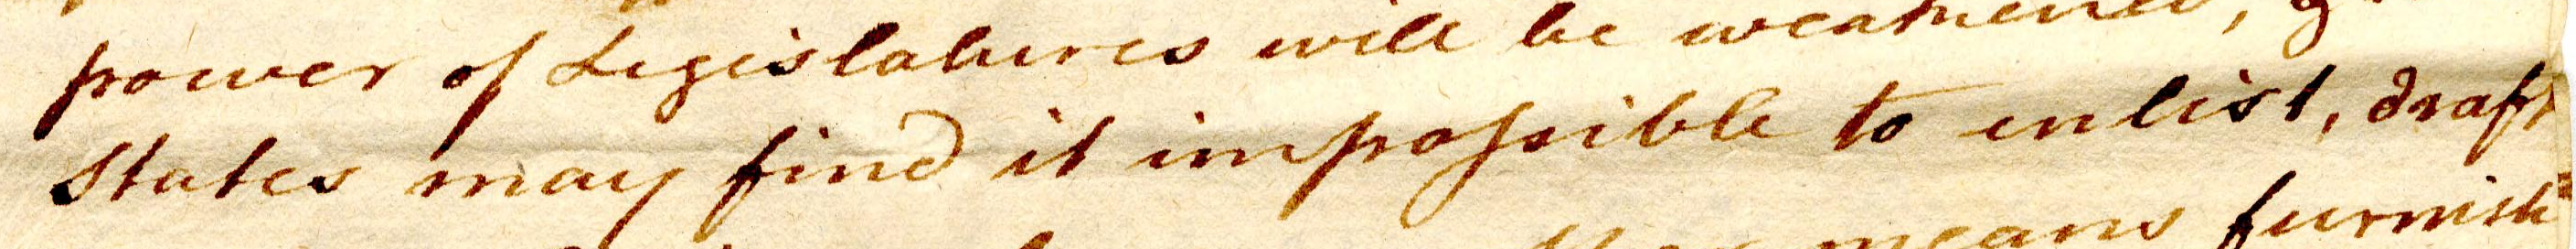states may find it impossible to enlist, draft
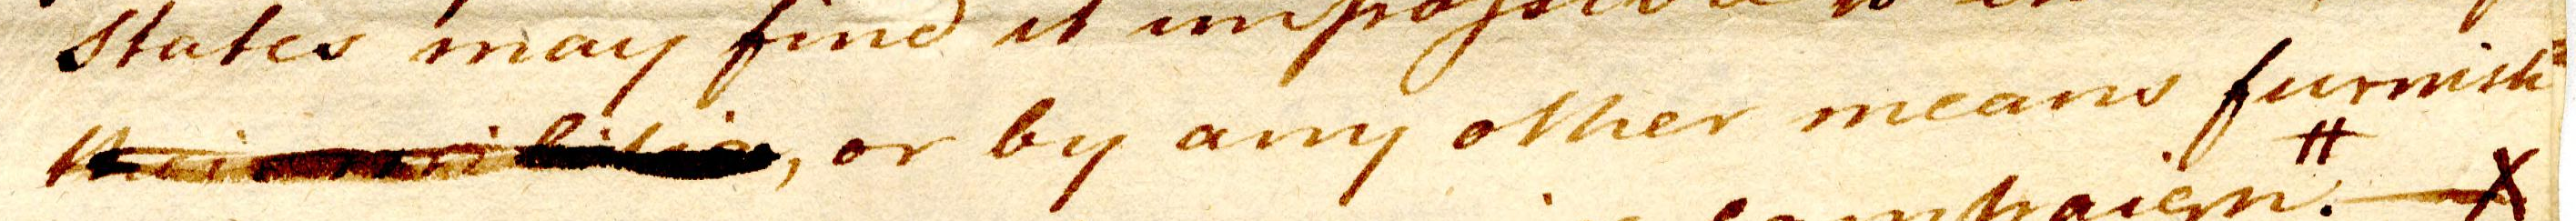[their _________], or by any other means furnish
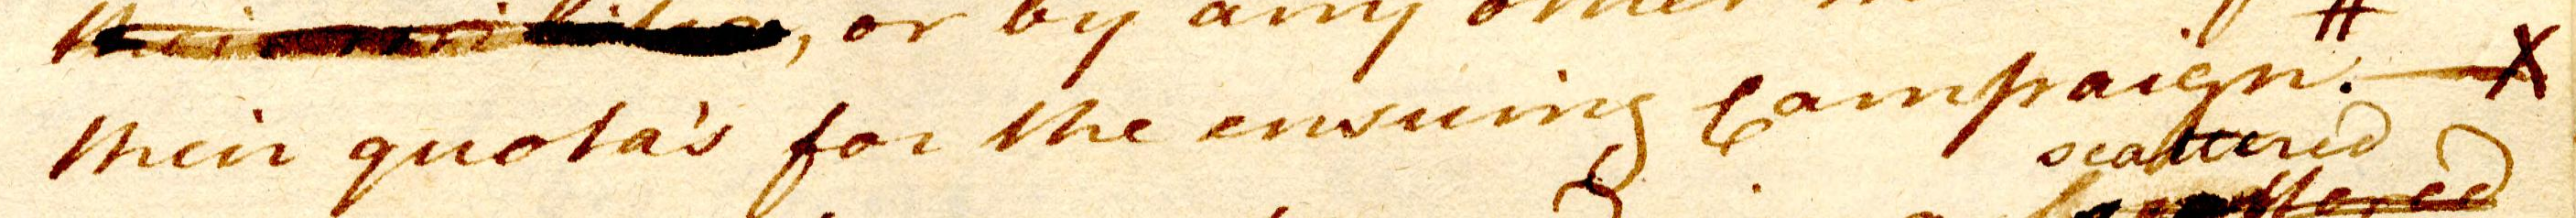their quota's for the ensuing Campaign. - X
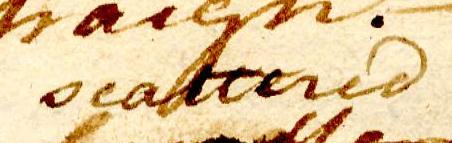scattered
